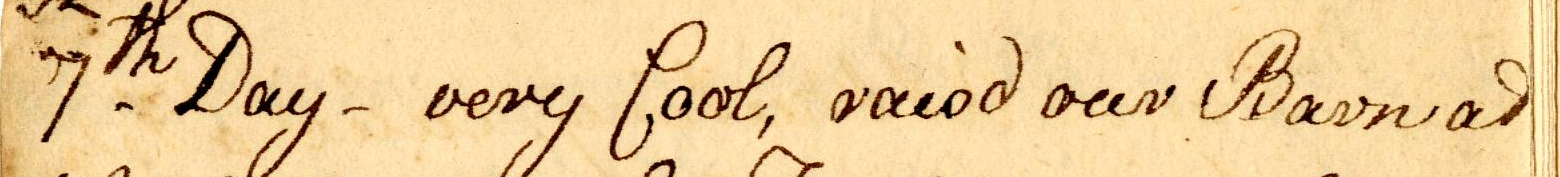7^th Day- very Cool, raisd our Barn at
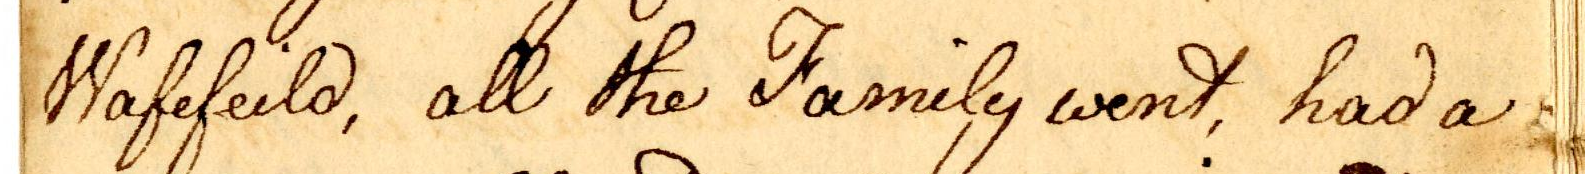Wafefeild, all the Family went had a
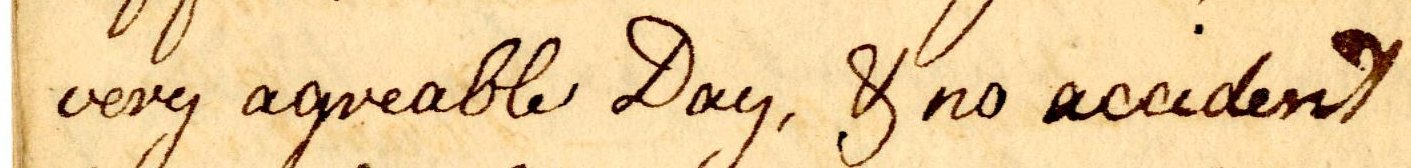very agreable Day, & no accident
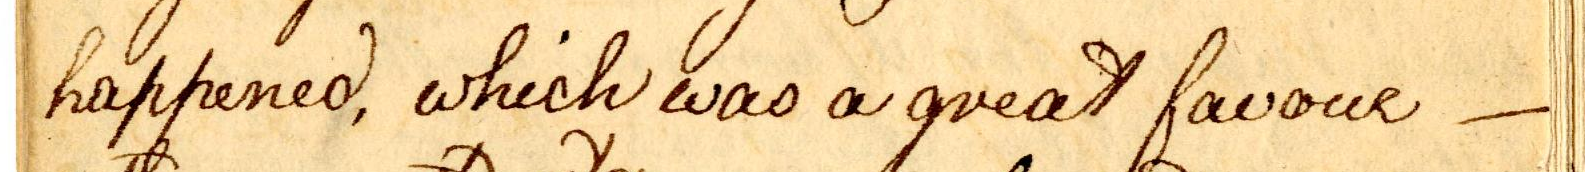happened, which was a great favour-
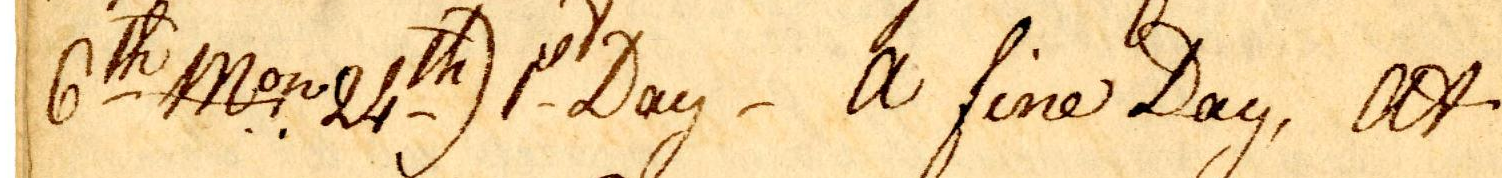6^th M^on 24^th) 1^st Day- A fine Day, At
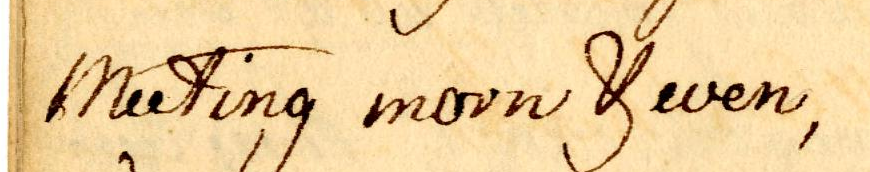Meeting morn & even,
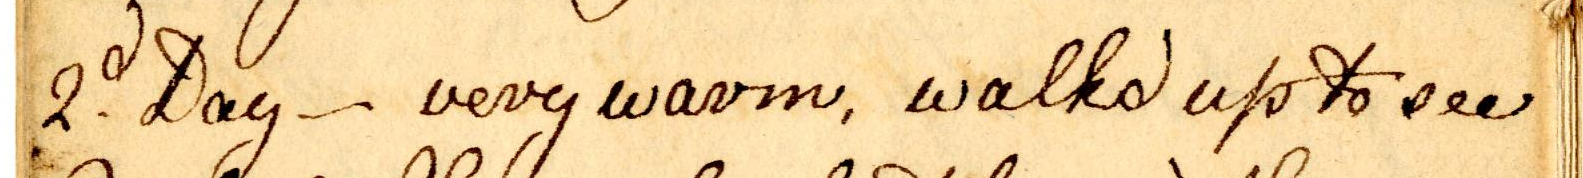2^d. Day- very warm, walkd up to see
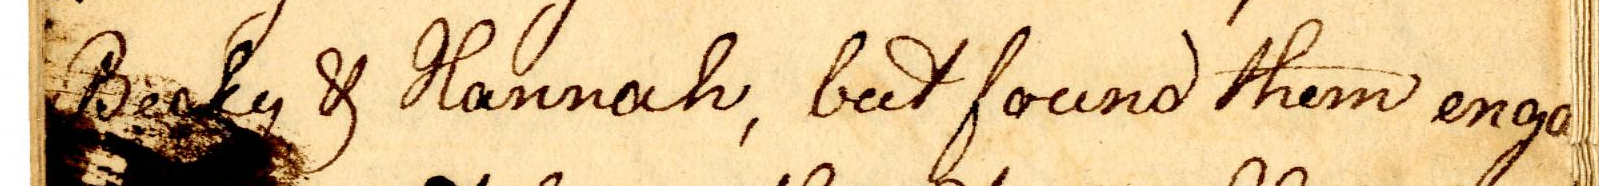Becky & Hannah, but found them engo
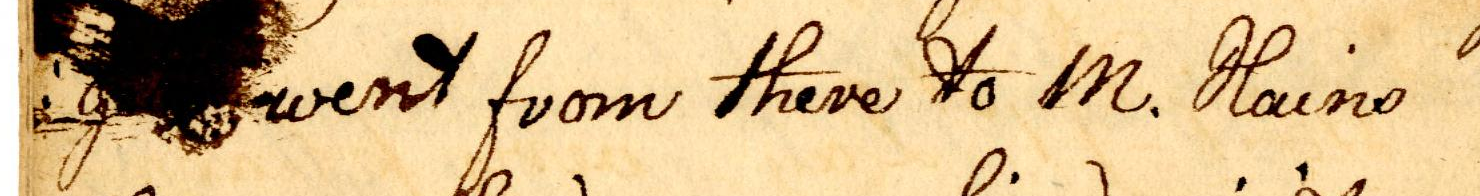g[__] went from there to M. Hains
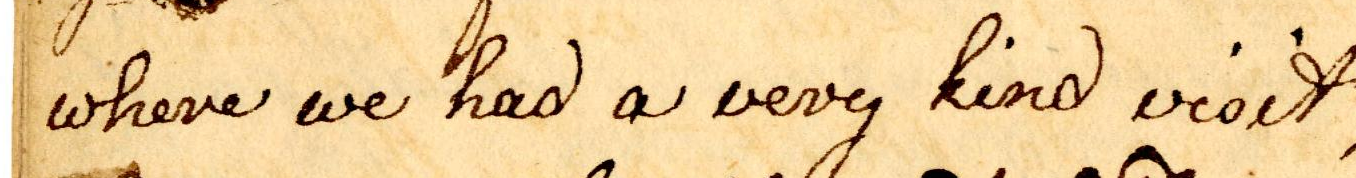where we had a very kind visit
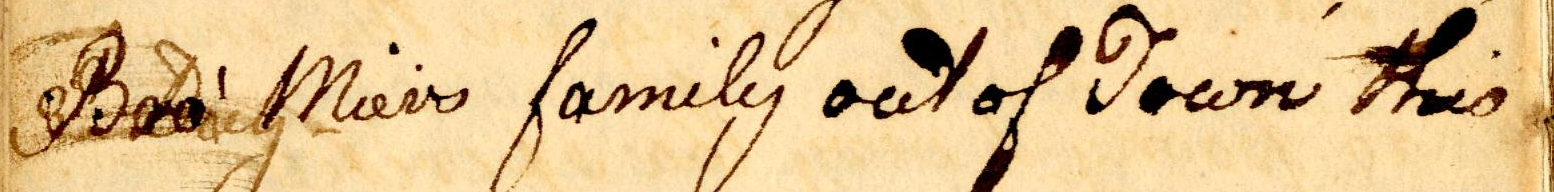Bro' Miers family out of Town this
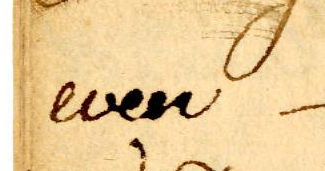even
